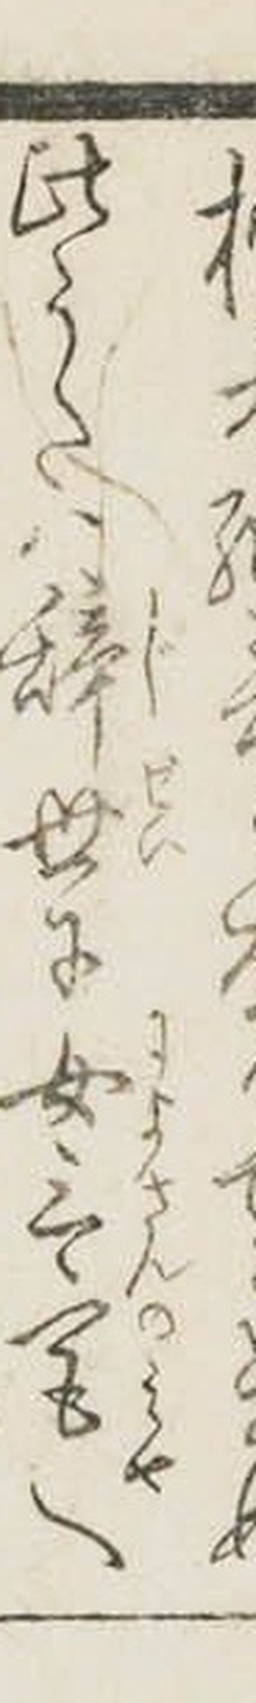此うたは辞世に女三宮へ
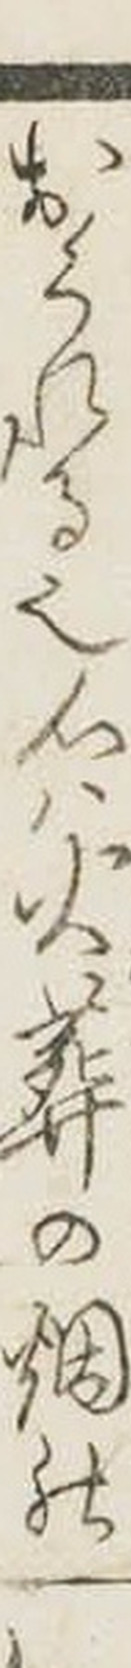おくれる也心は火葬さうの烟の
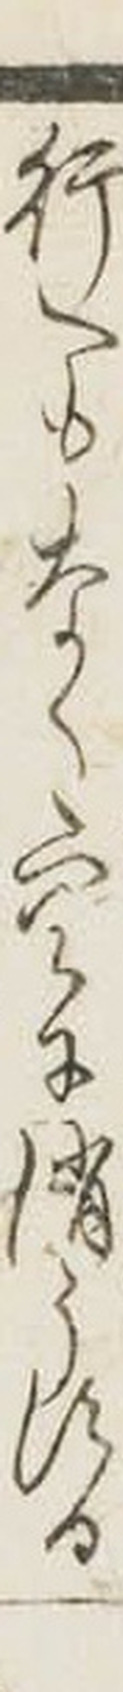行へもなく空に消うする
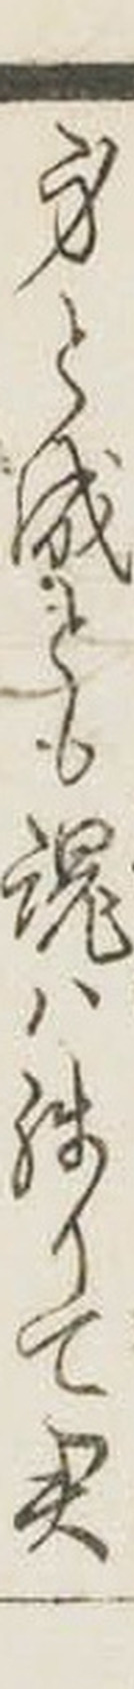身と成とも魂は残りて君
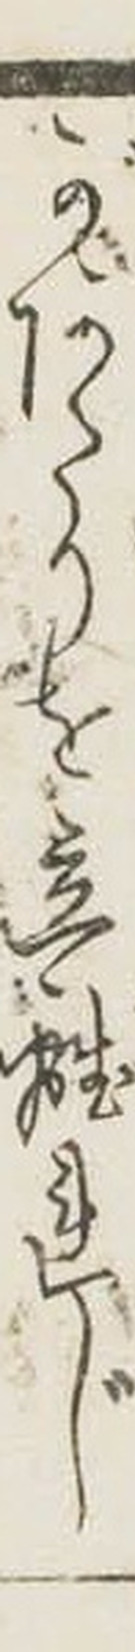があたりを立離れじ
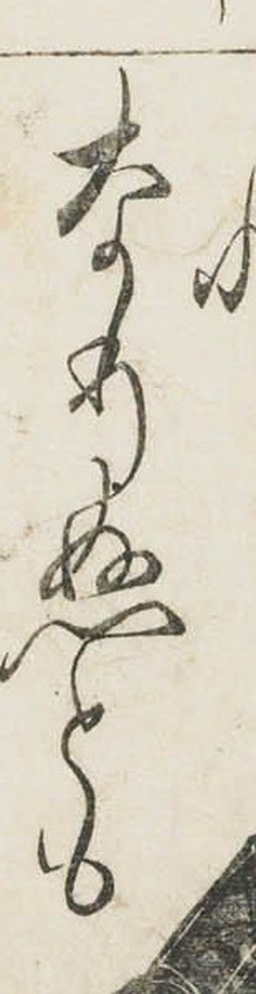なりぬとも
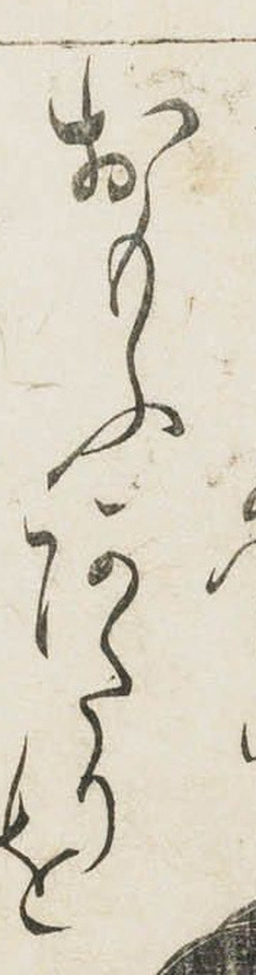おもふあたりを
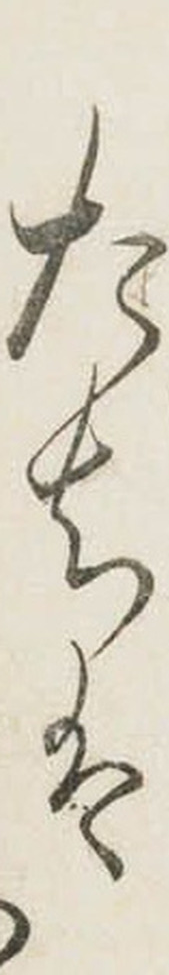たちは
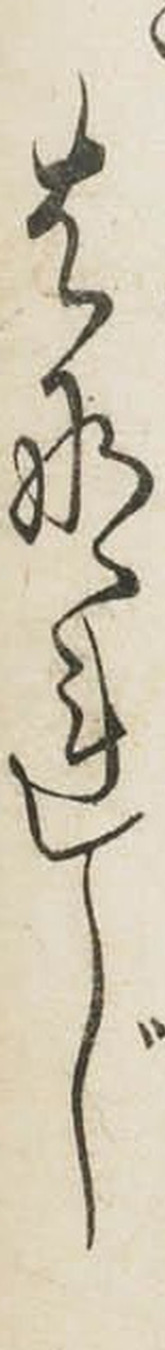はなれじ
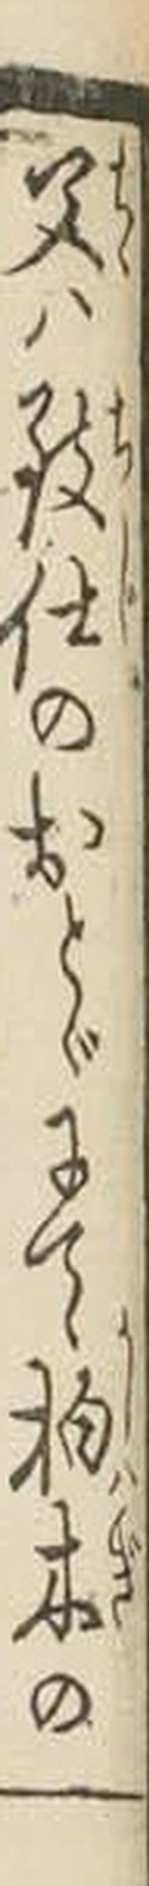父は致仕のおとゞにて柏木の
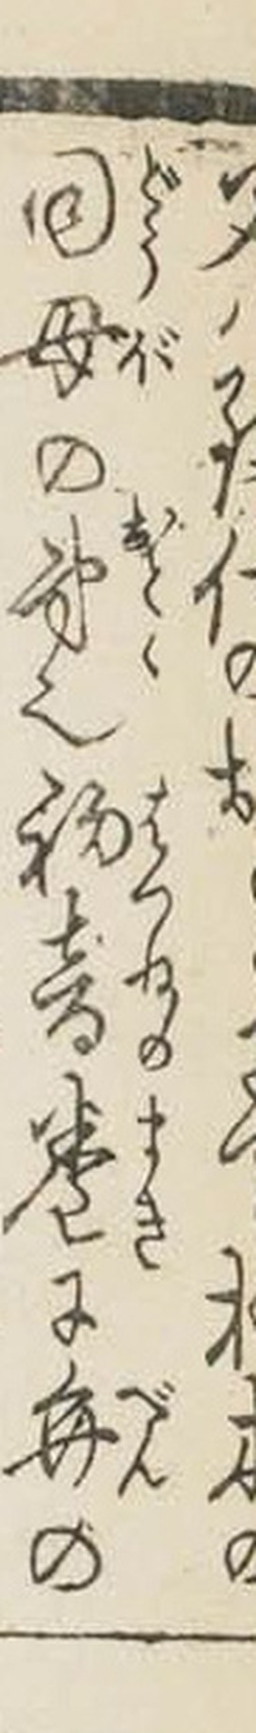同母の弟也初音巻に弁の
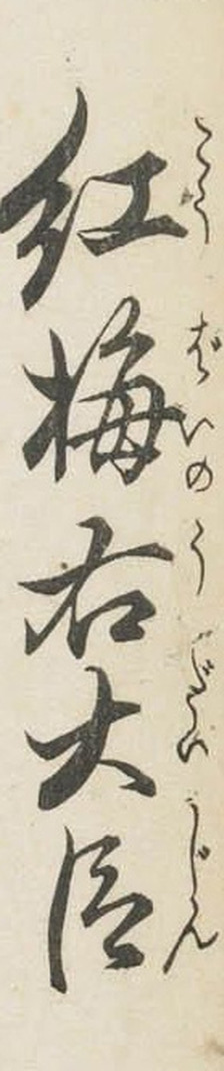紅梅右大臣
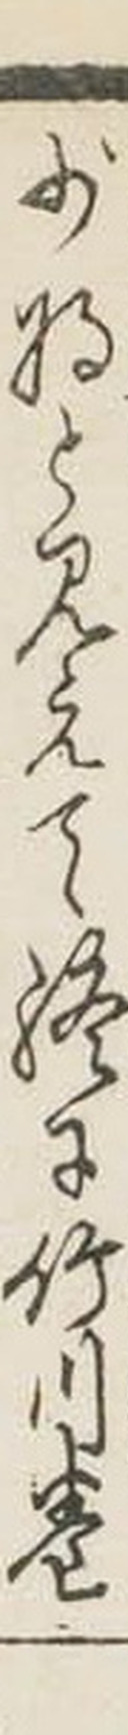少将と見えて終に竹川巻
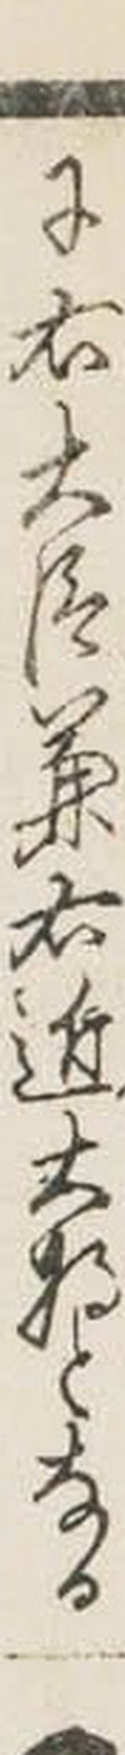に右大臣兼右近大将となる
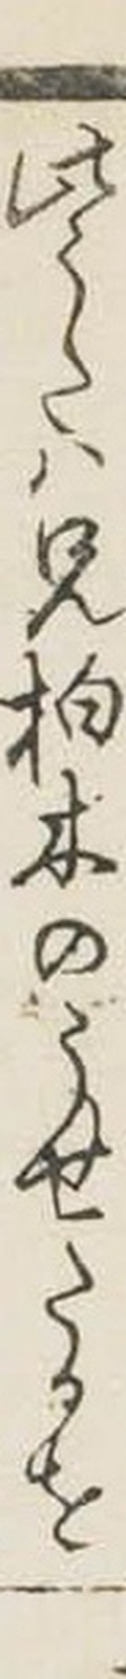此うたは兄柏木のうせたるを
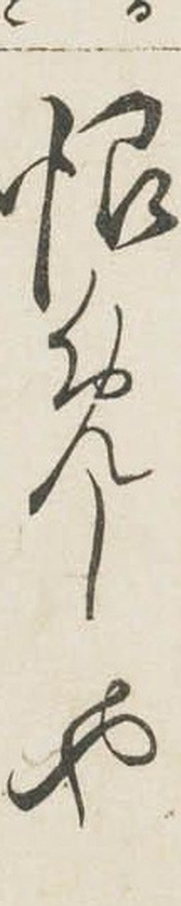恨めしや
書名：源氏百人一首
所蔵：東京学芸大学教育コンテンツアーカイブ
